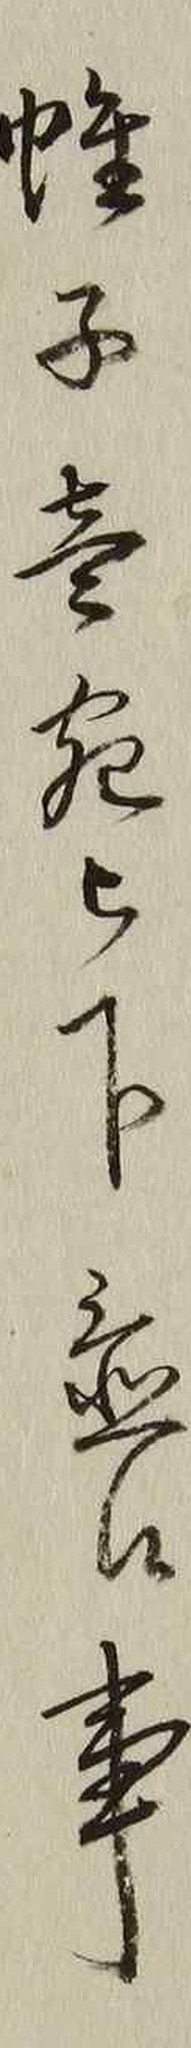帷子壱宛被下置候事
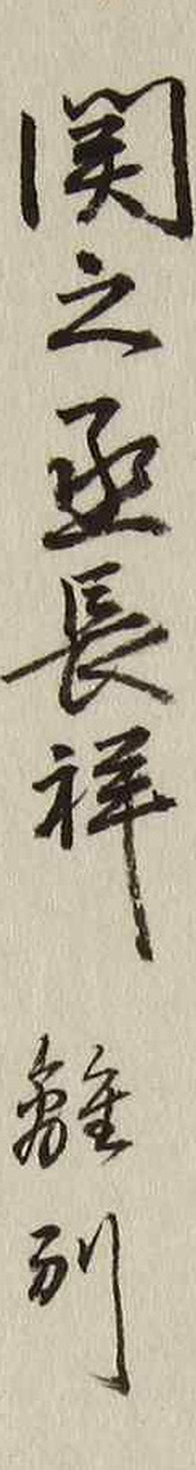関之丞長祥離別
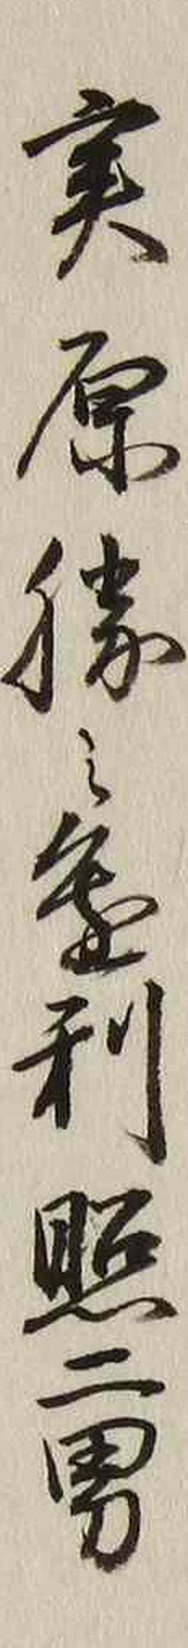実原勝之進照二男
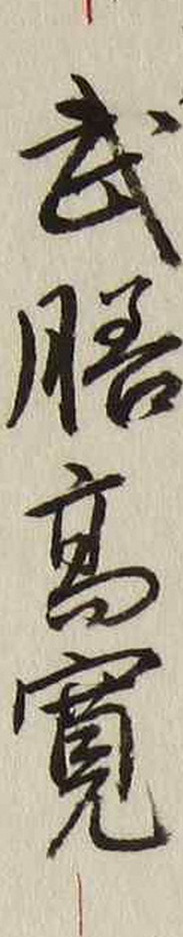武膳高寛
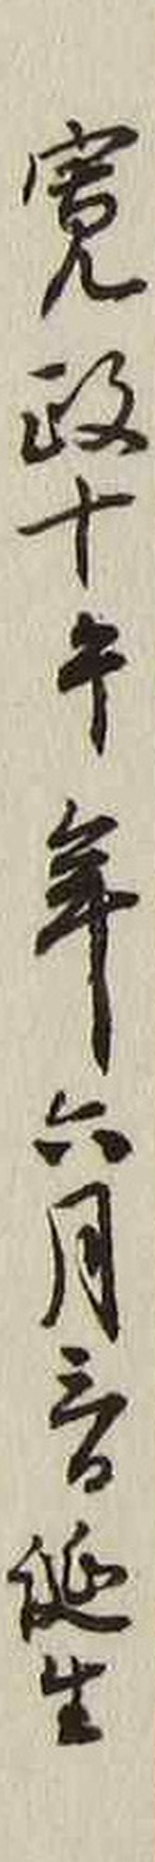寛政十午年六月三日誕生
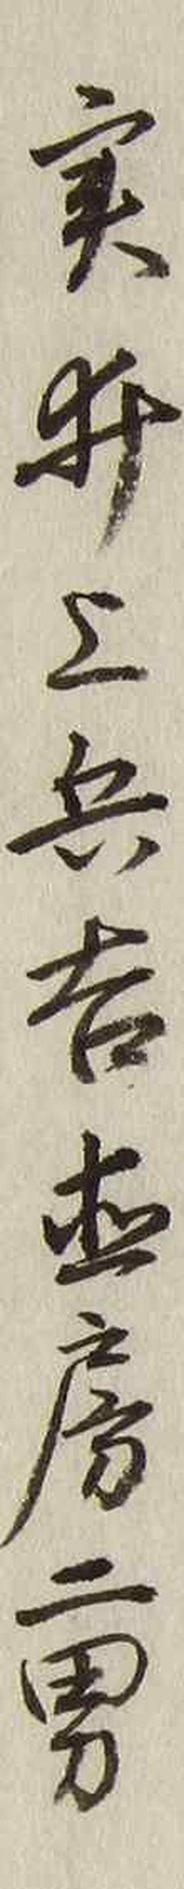実井上兵吉直房二男

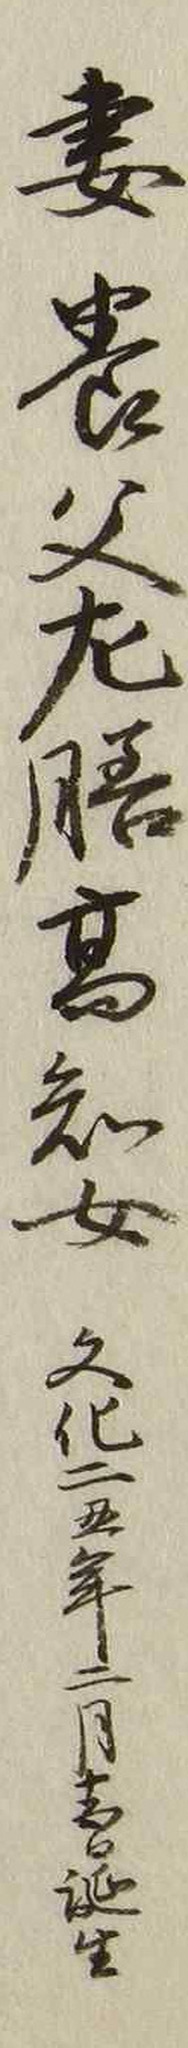妻養父左膳高知女文化二丑年二月十五日誕生
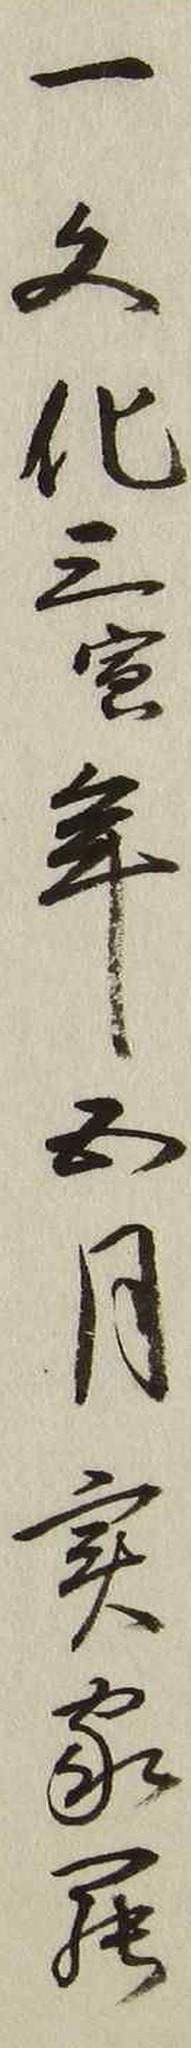一文化三寅年五月実家罷
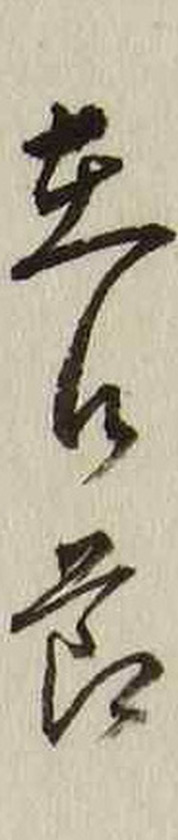在候節
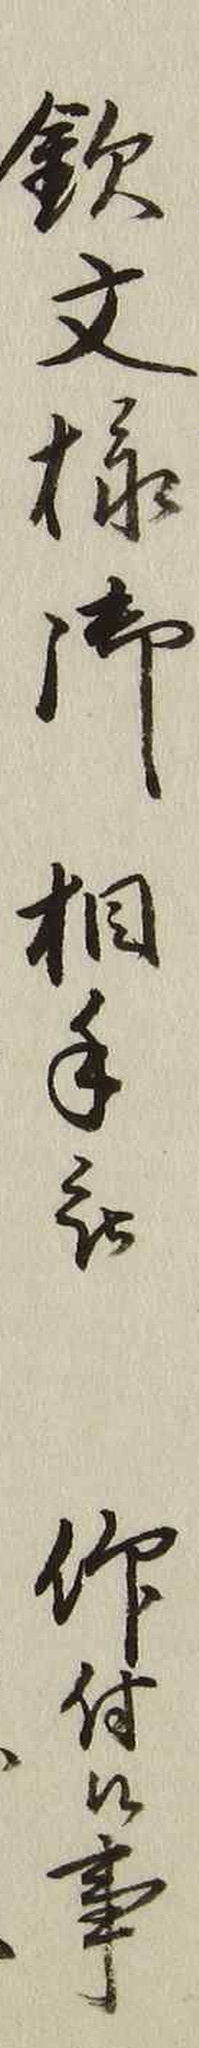欽文様御相手被仰付候事
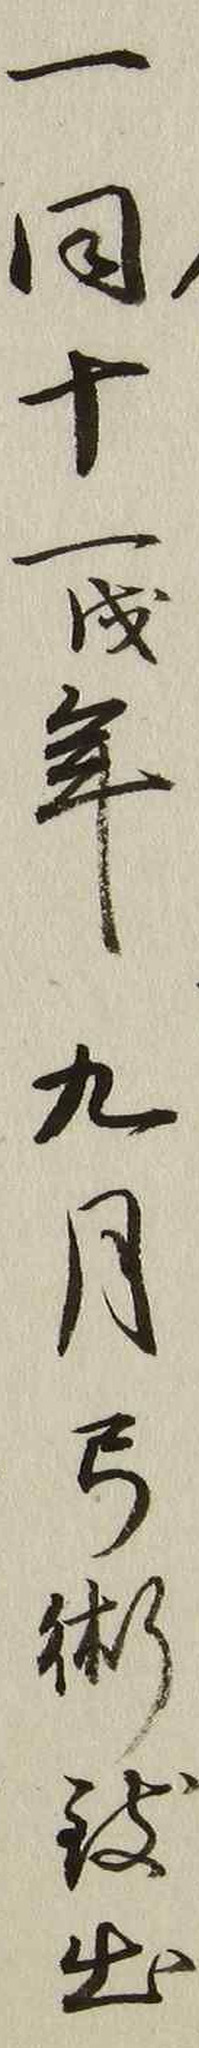一同十一戌年九月弓術致出
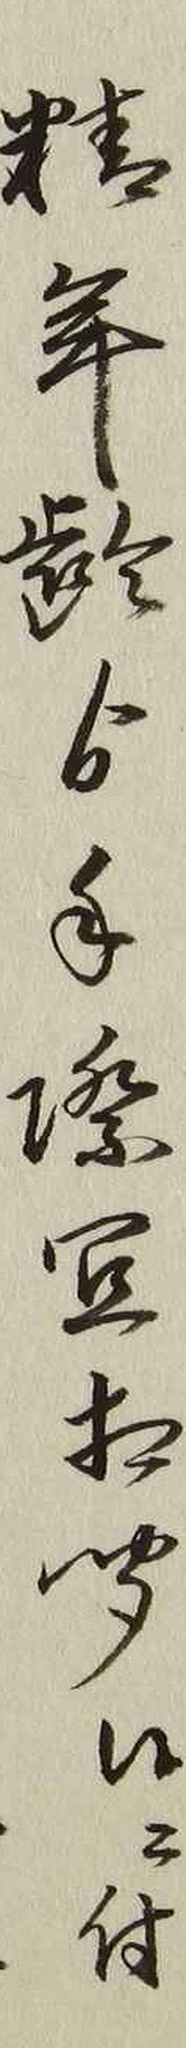精年齢ゟ手際宜相聞候ニ付
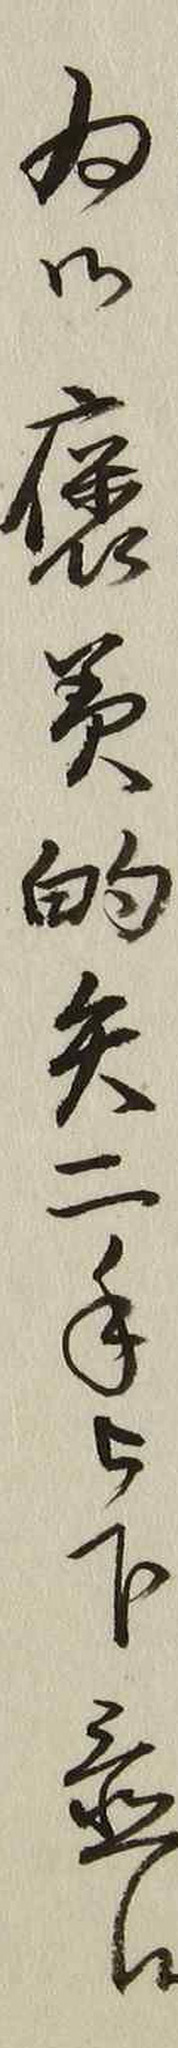為御褒美的矢二手被下置候
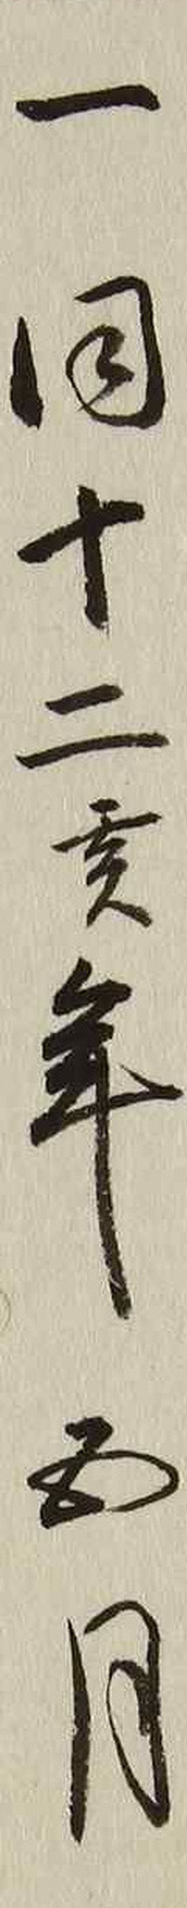一同十二亥年五月
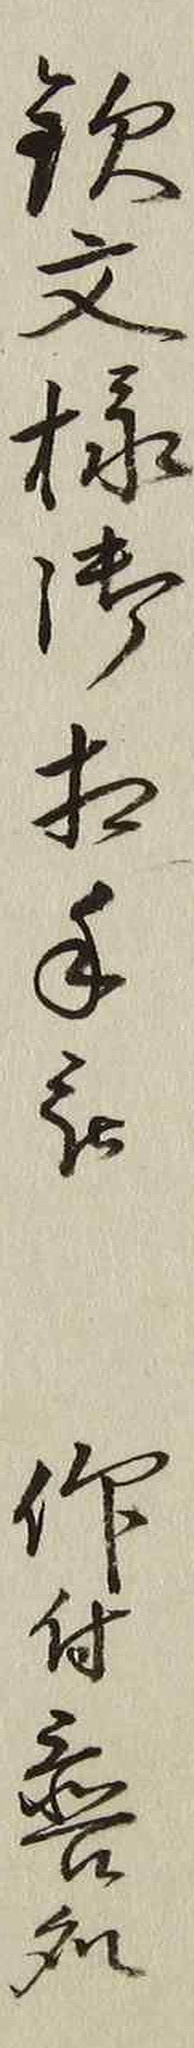欽文様御相手被仰付置候処
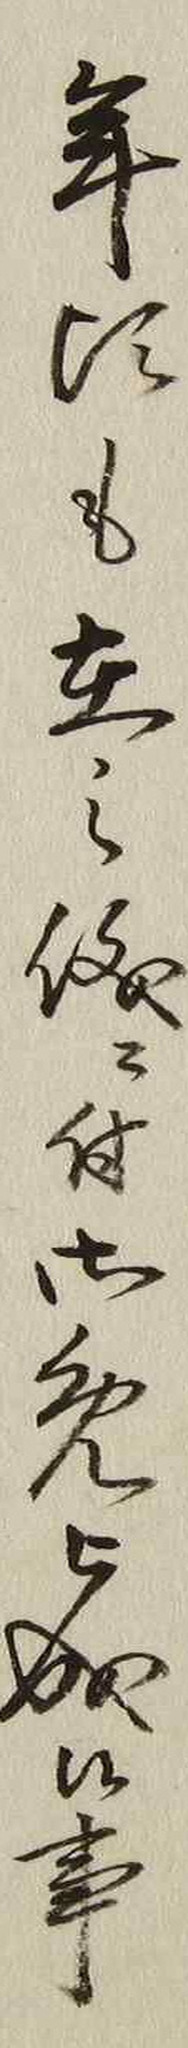年頃も在之儀ニ付御免被成候事
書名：諸士系譜　巻之136　た之部12
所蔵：会津若松市立会津図書館
